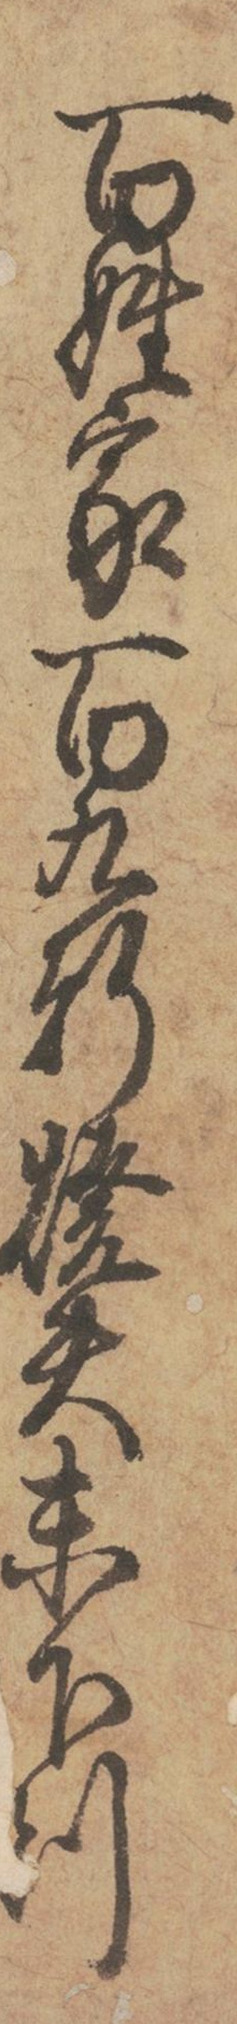百姓家百九軒焼失未下刻
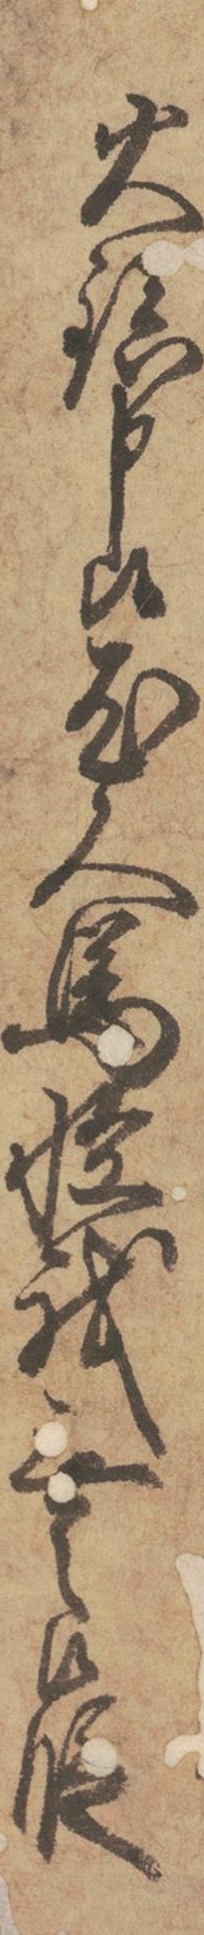火鎮申候尤人馬怪我無之候段
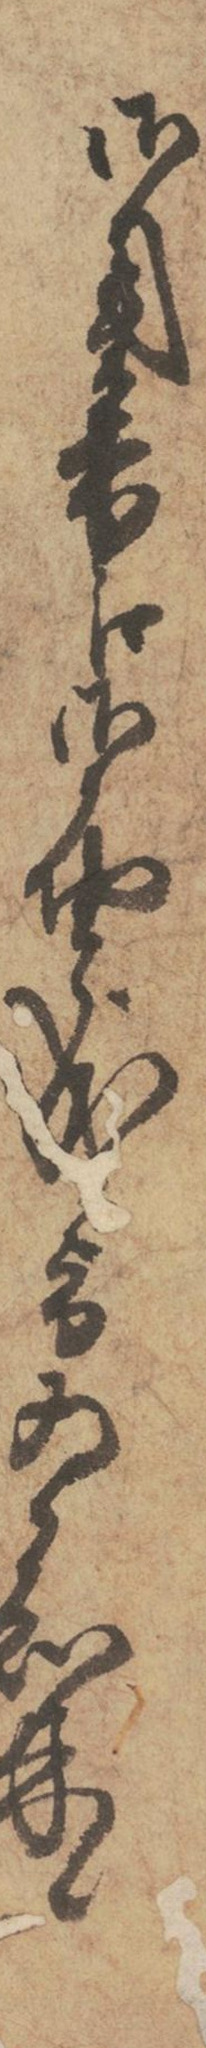御用番え御届被成旨為御知来候
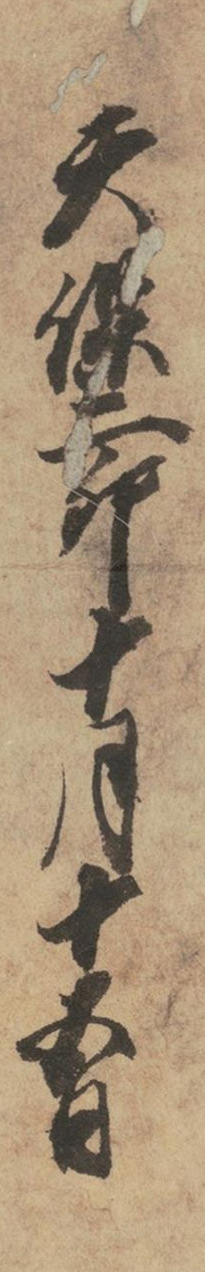天保二卯十月十五日
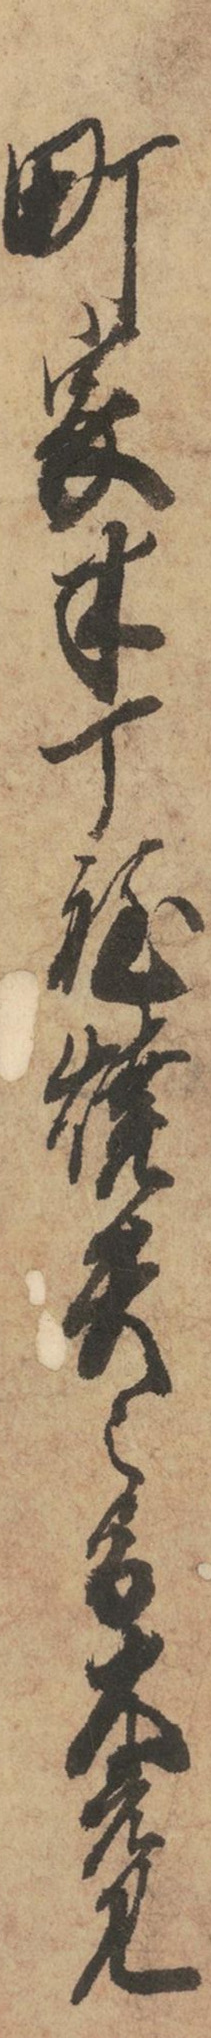壱本松町家半丁程焼失之旨火元見
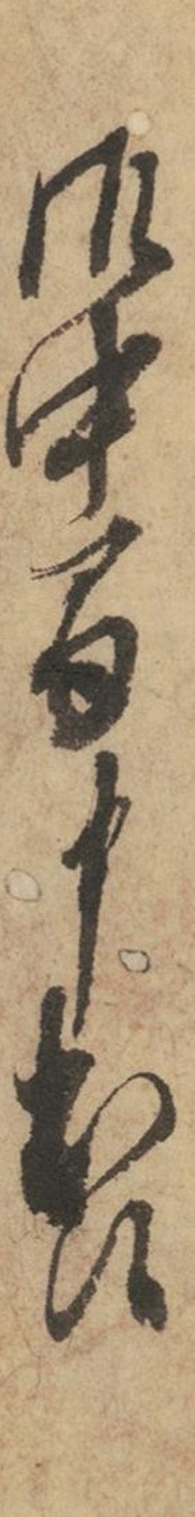御中間申出候
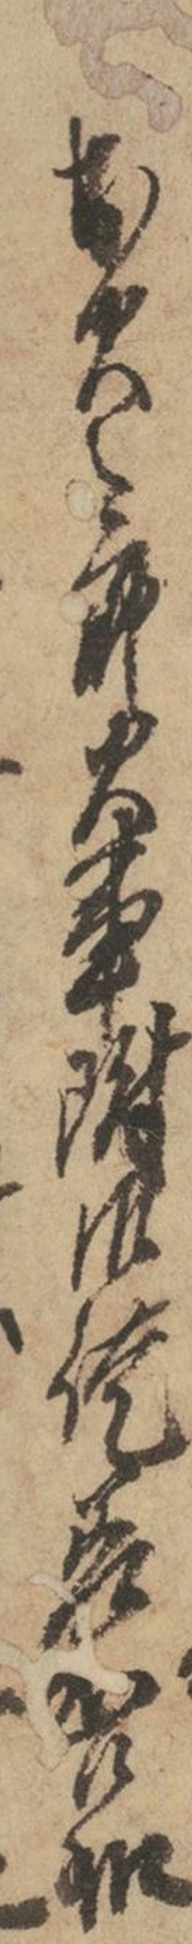出火之節火事附御徒差出候処
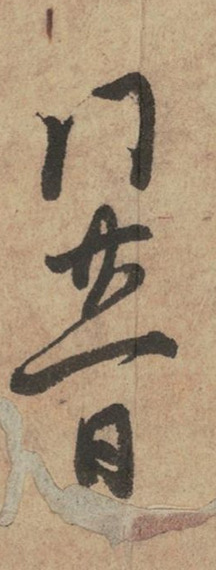同廿一日
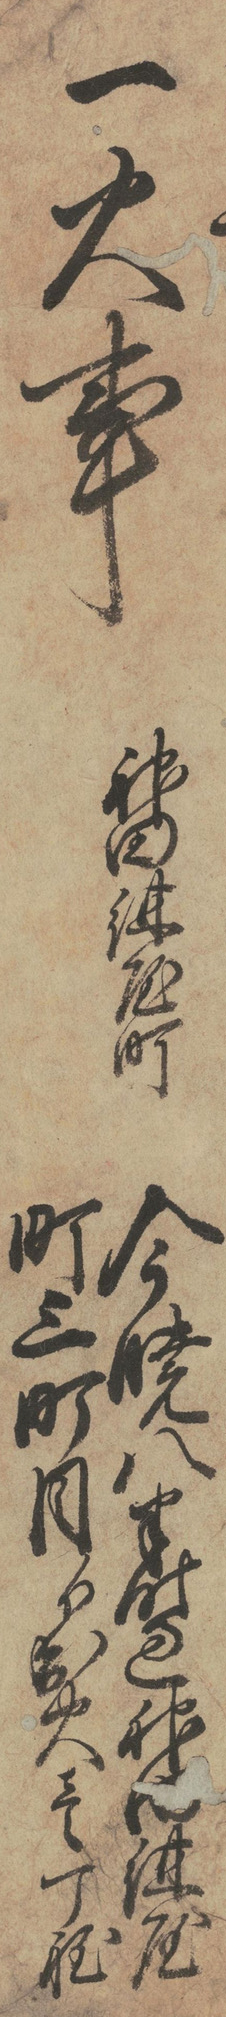一火事神田紺屋町今暁八半時過神田紺屋
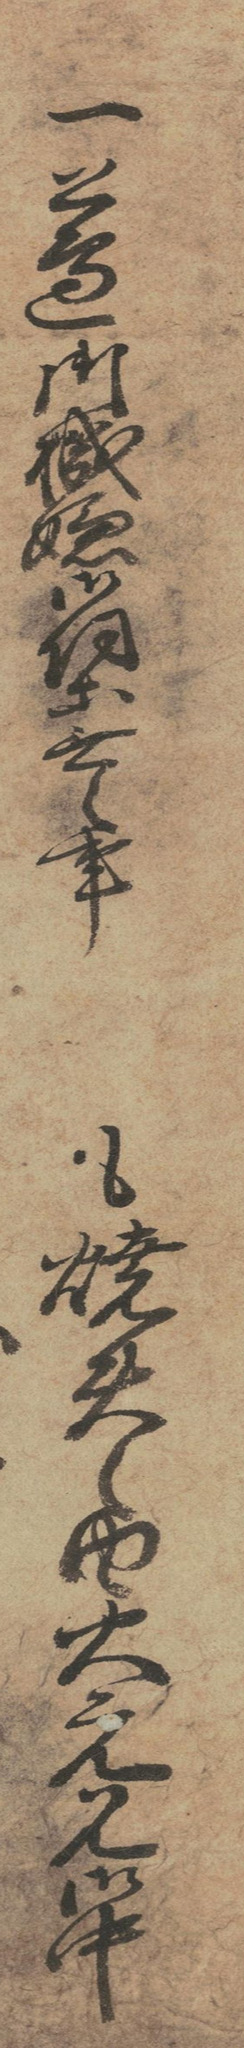一公辺御機嫌御伺等無之事も焼失之由火元見御中
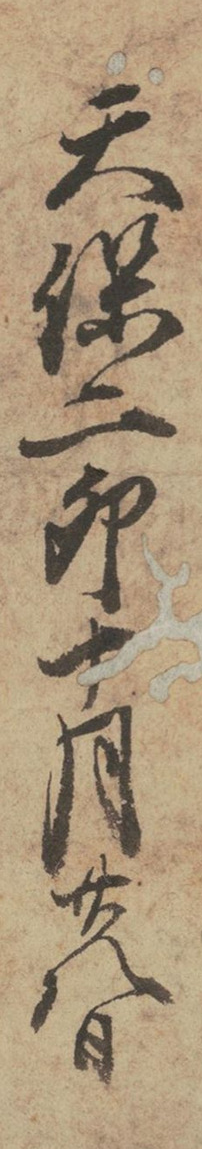天保二卯十月廿八日
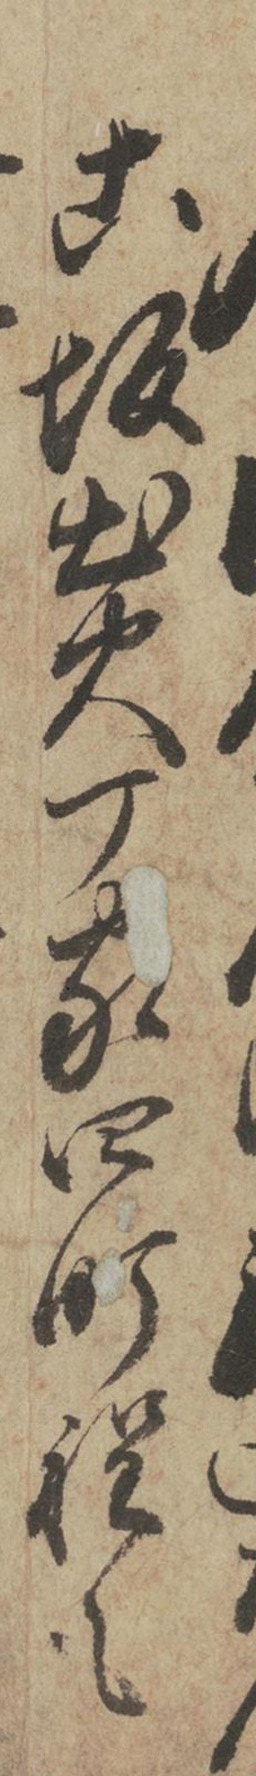こ坂出火丁家四町程も
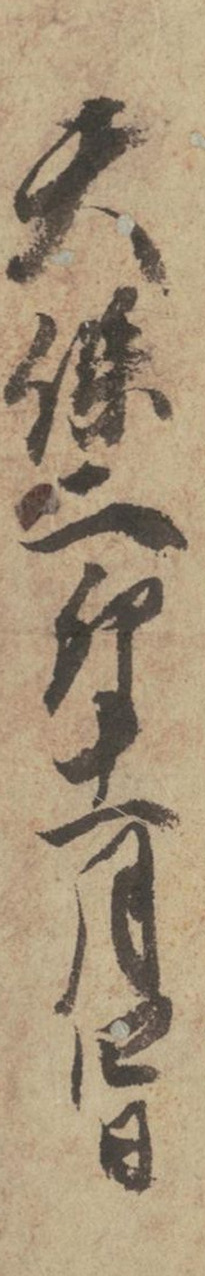天保二卯十月十五日
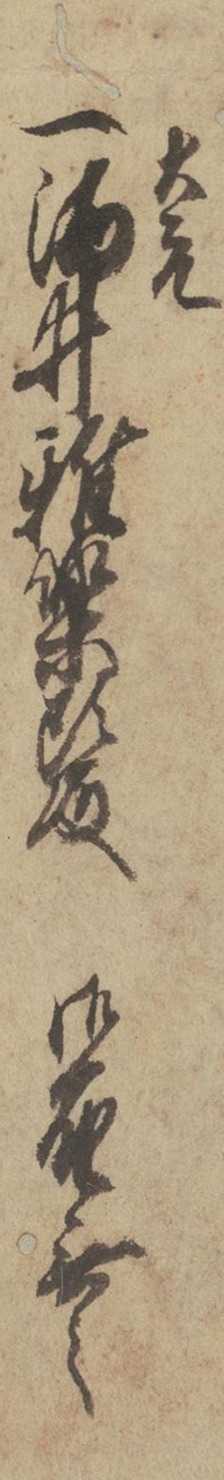一酒井雅樂頭殿御届無之
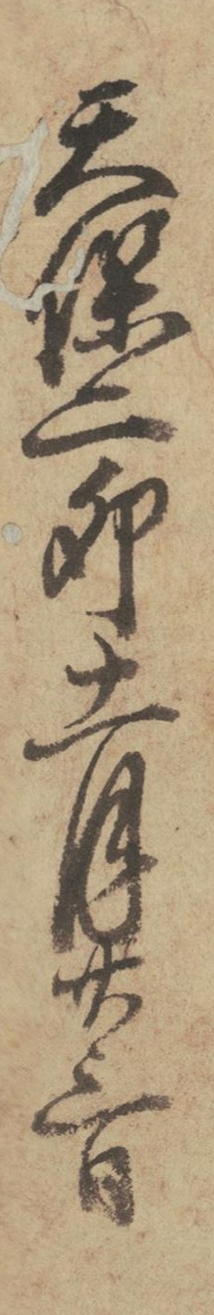天保二卯十月廿八日
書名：[紀州藩災害記録]
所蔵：東京大学地震研究所図書室 Earthquake Research Institute Library, The University of Tokyo, JAPAN
